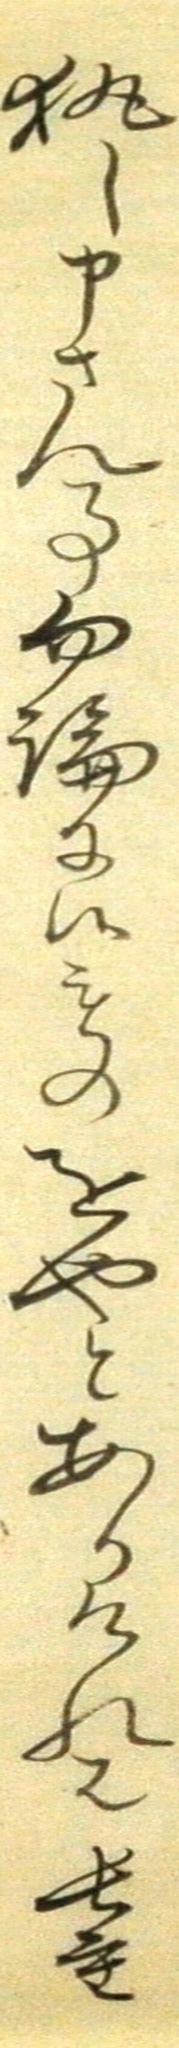執し申さん事勿論に候ものをやとありけれは長重
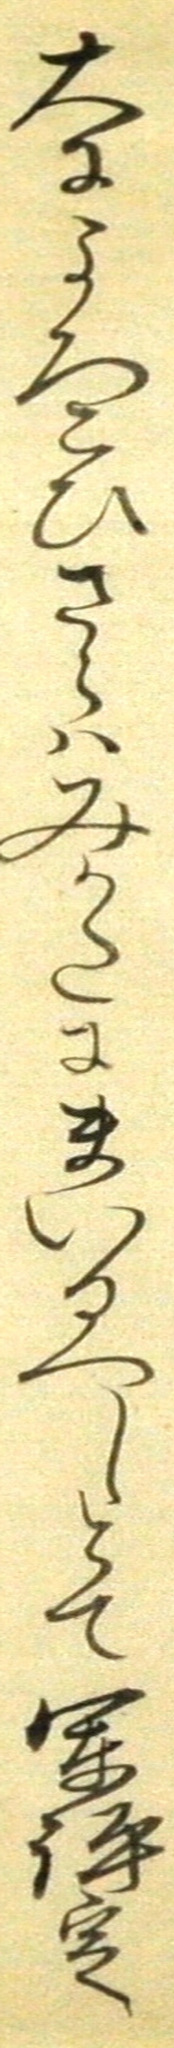大によろこひさらはみかたにまいるへしとて軍評定
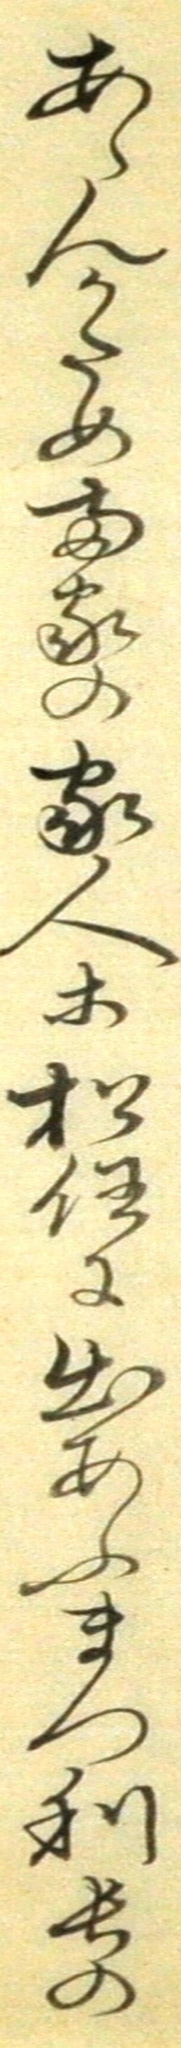あらんかため両家の家人等松任に出あふまつ利長の
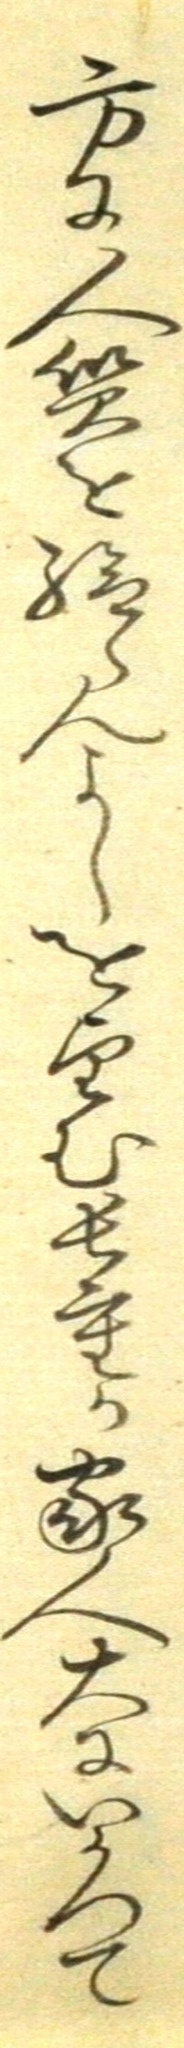方に人質を給らんよしを望む長重か家人大にいかつて
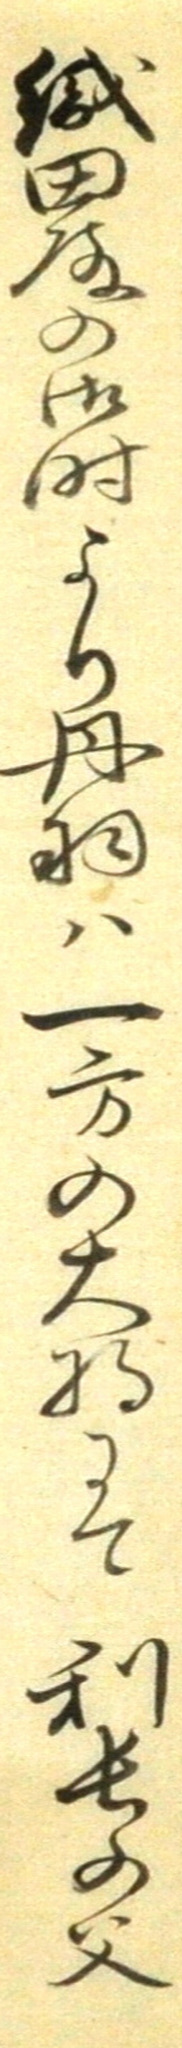織田殿の御時より丹羽は一方の大将にて利長の父
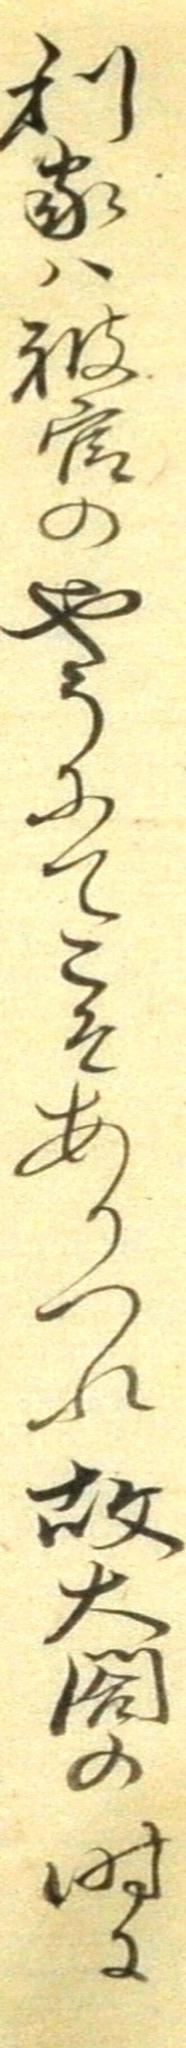利家は被官のやうにてこそありつれ故大閤の時に
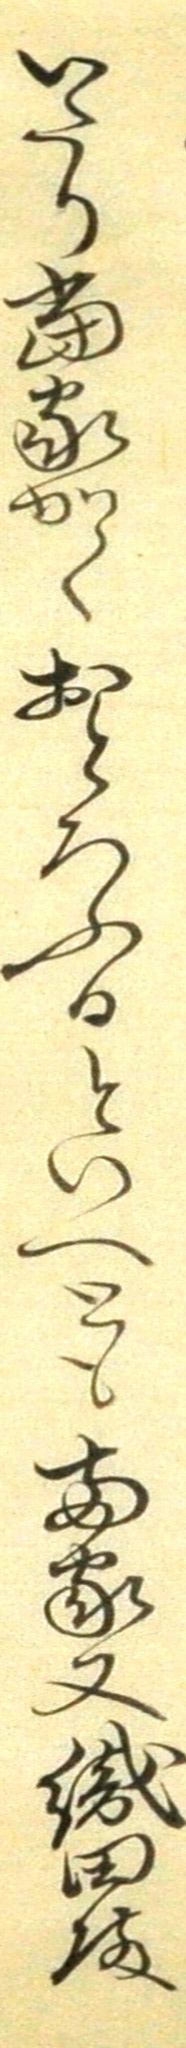いたり当家かくおとろふるといへとも両家又織田殿
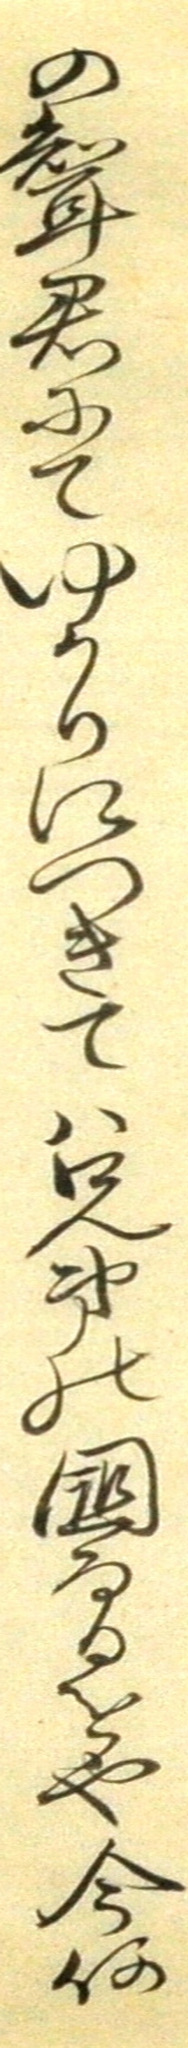の聟君にてゆかりにつきては兄弟の国なるをや今何
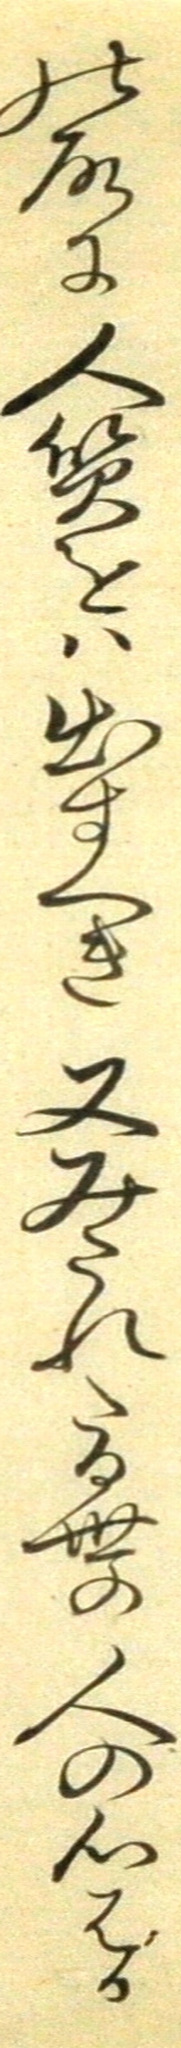の故に人質をは出すへき又みたれたる世の人の心はか
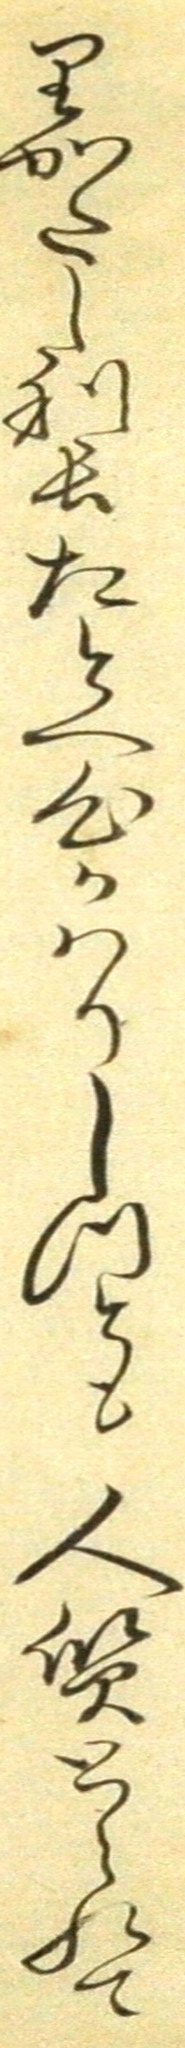りかたし利長たとへ心かはりしつとも人質としれて
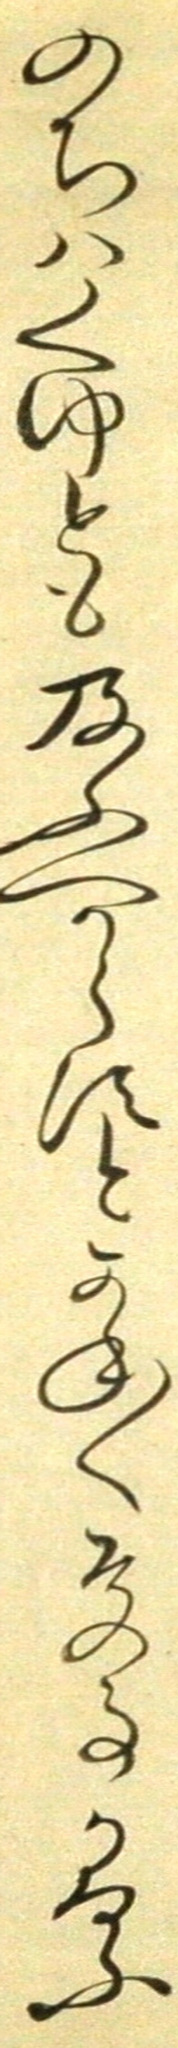のちはくゆとも及ふへからすとかね〳〵その事かなふ
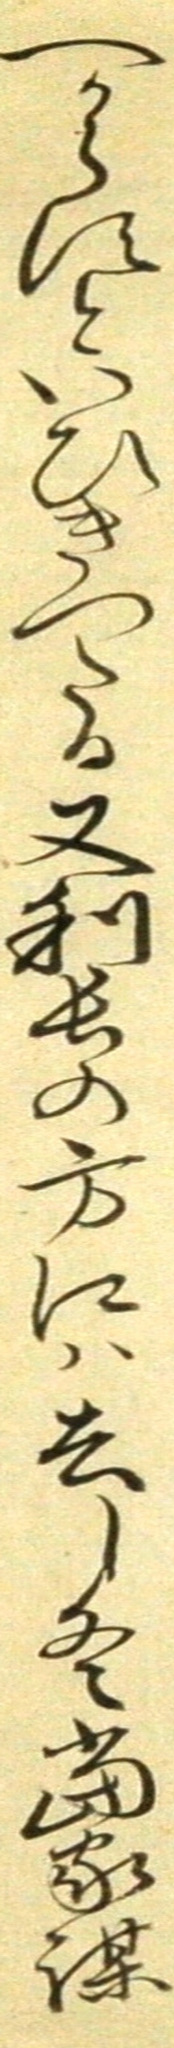はからすといひきつたる又利長の方には去し冬当家謀
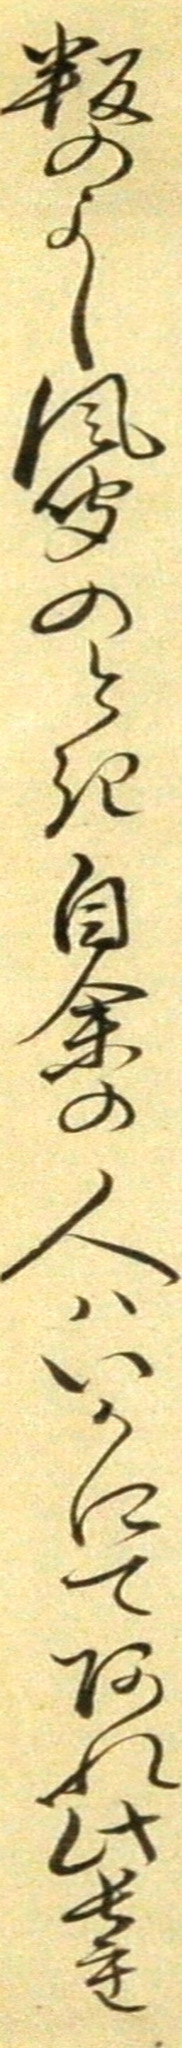叛のよし風聞のとき自余の人はいかにてあれ此長重
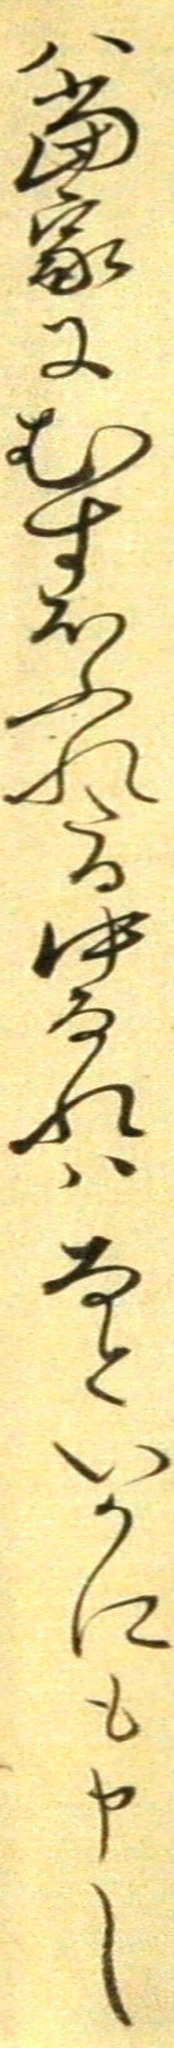は当家にむすほふれたる中なれはなといかにも申し

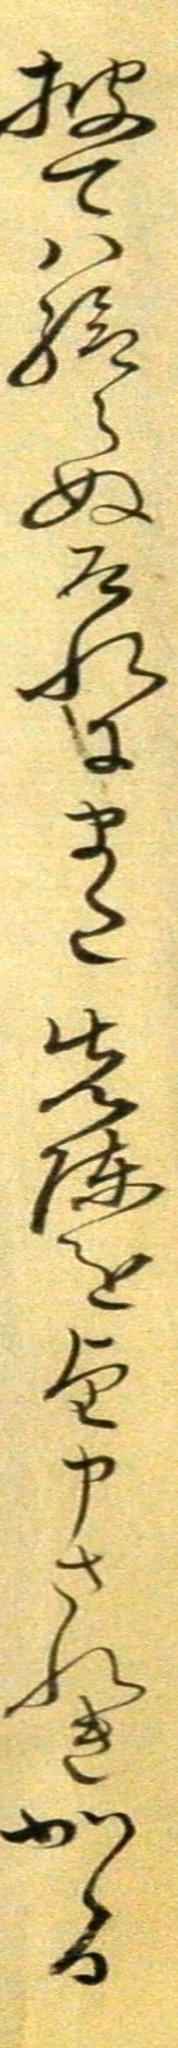披ては給らぬそれにまた先陣を望申されきかゝる
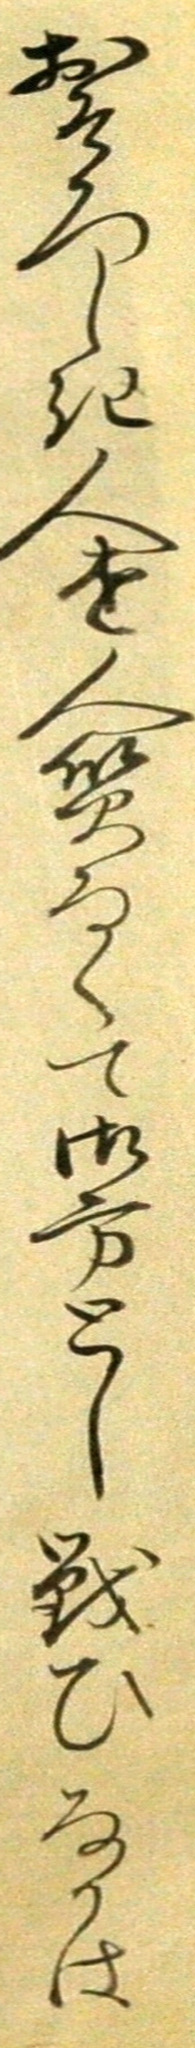おそろしき人を人質なくて御方とし戦ひなかは
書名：藩翰譜（八・下）
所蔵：伊那市立高遠町図書館・合同会社AMANE
